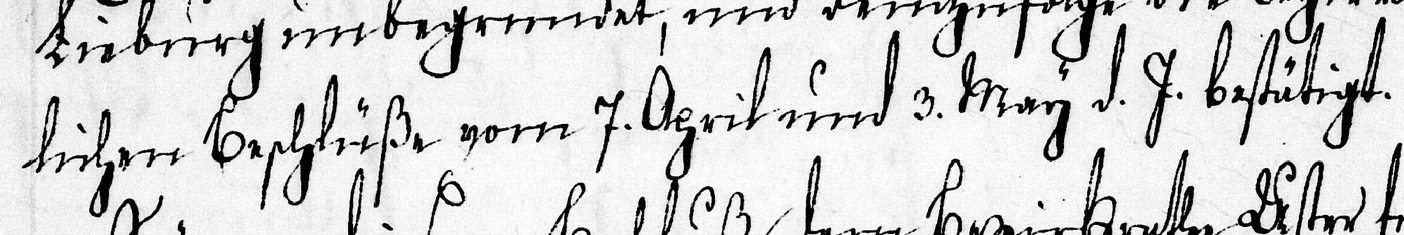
hlichen Beschlüße vom 7. April und 3. May d. J. bestätigt.
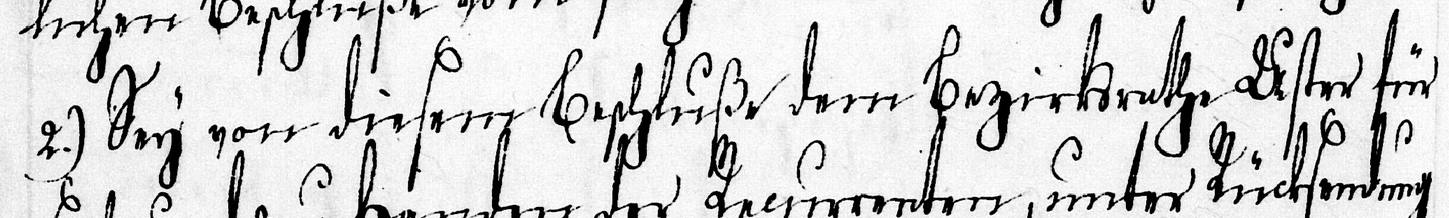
2.) Sey von diesem Beschluße dem Bezirksrathe Uster für
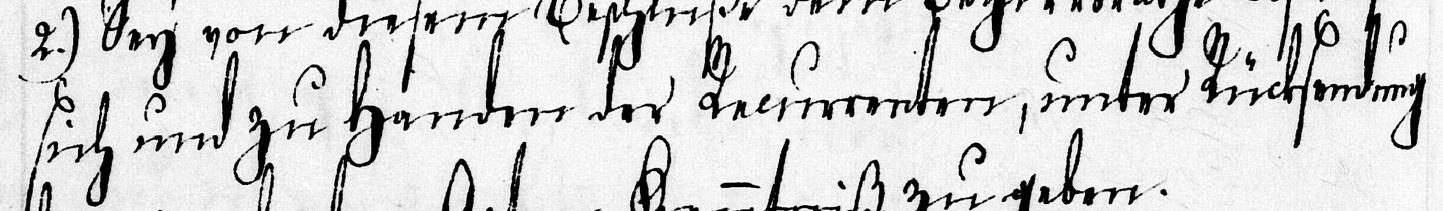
sich und zu Handen der Recurrenten, unter Rücksendung
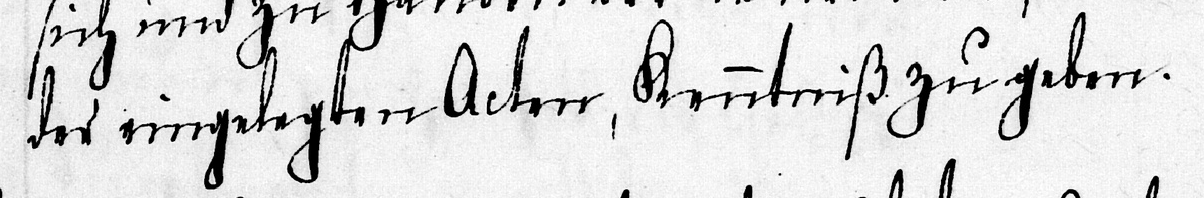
der eingelegten Acten, Kenntniß zu geben.
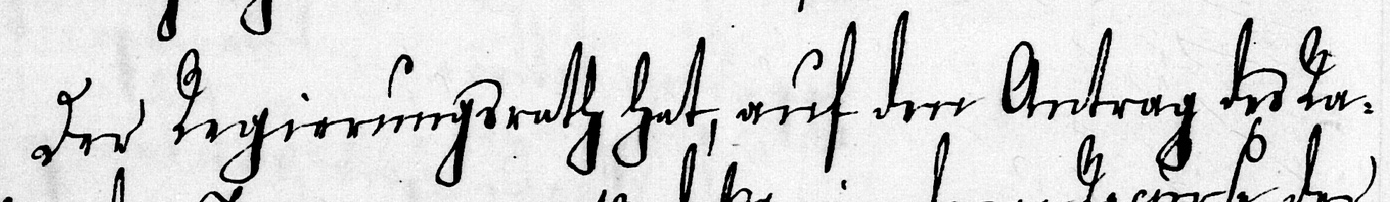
Der Regierungsrath hat, auf den Antrag des Ra¬
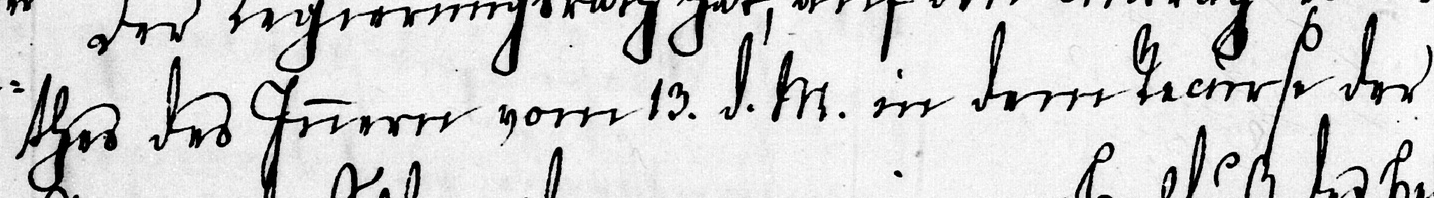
thes des Innern vom 13. d. M. in dem Recurse der
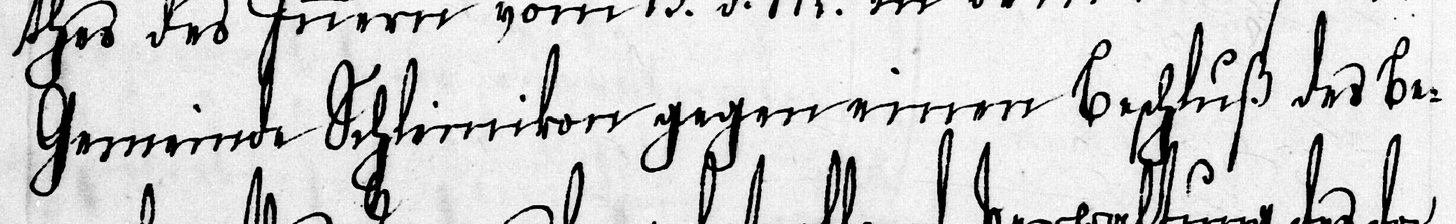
Gemeinde Schlinikon gegen einen Beschluß des Be¬
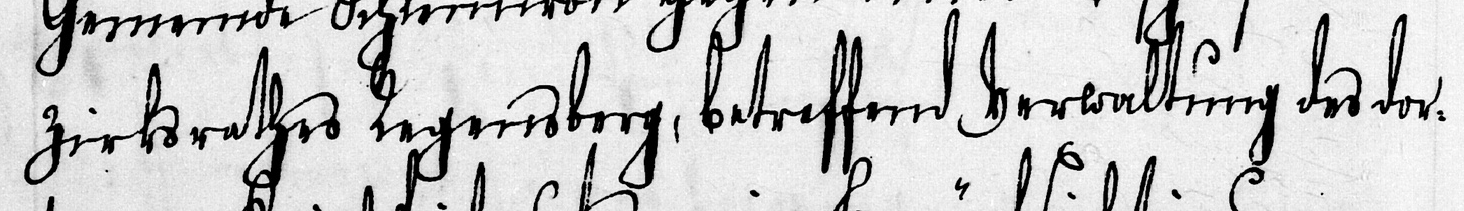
zirksrathes Regensberg, betreffend Verwaltung des dor¬
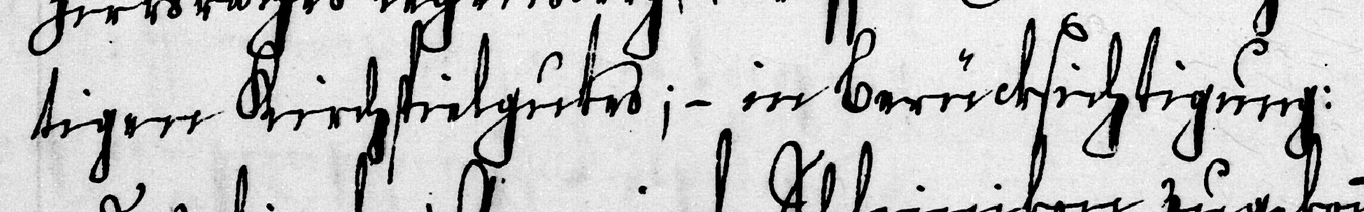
tigen Kirchspielgutes; – in Berücksichtigung:
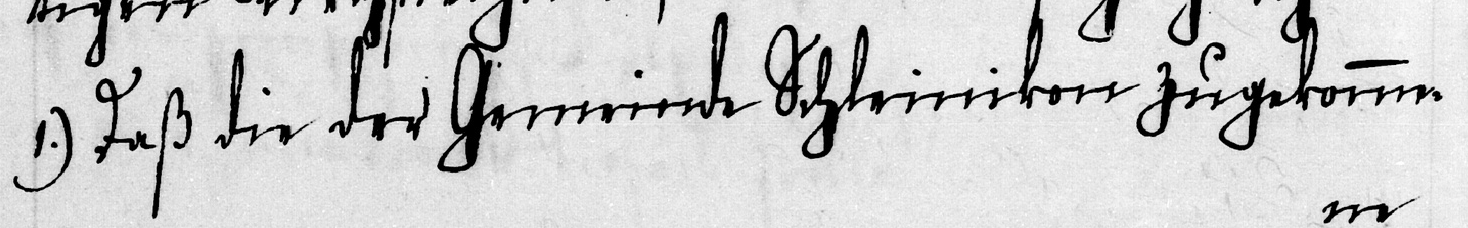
1.) Daß die der Gemeinde Schleinikon zugekomme-
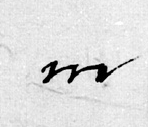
ie
